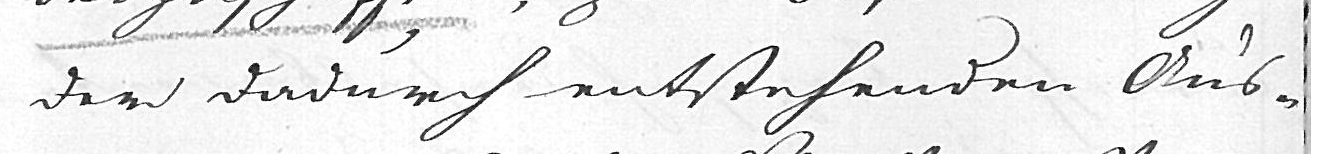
der dadurch entstehenden Aus-
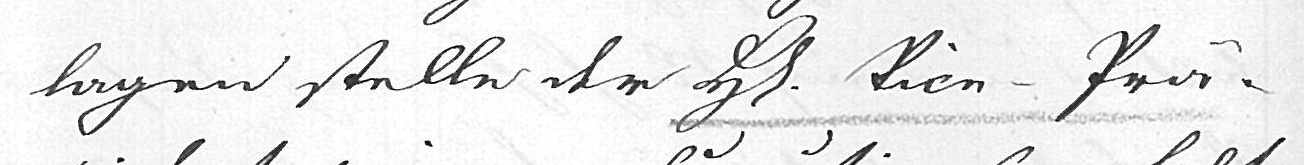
lagen stelle der H. Vice-Prä-
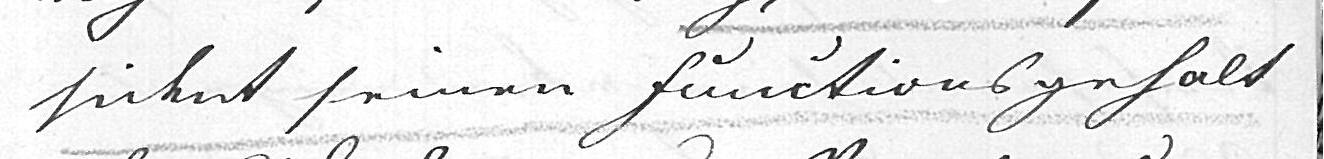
sident seinen Functionsgehalt
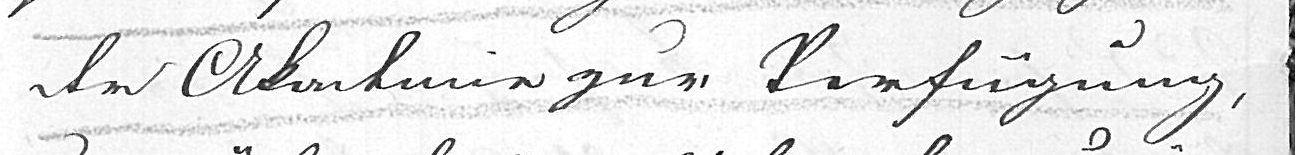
der Akademie zur Verfügung
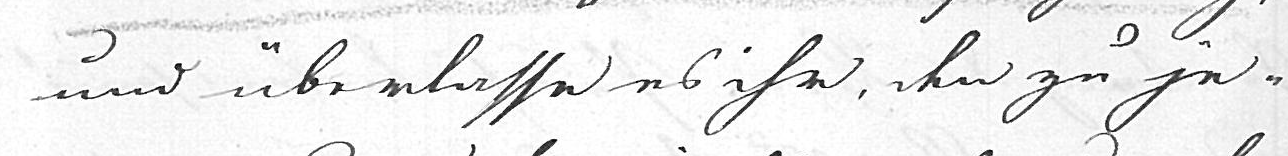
und überlasse es ihr, den zu je-
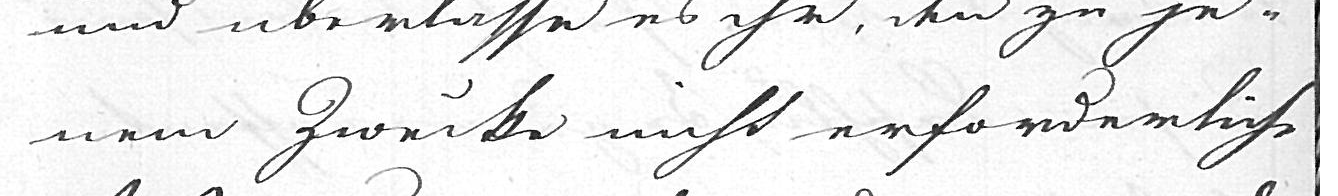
nem Zwecke nicht erforderlichen
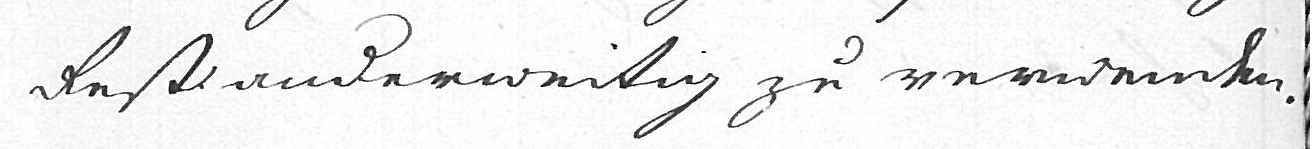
Rest anderweitig zu verwenden.
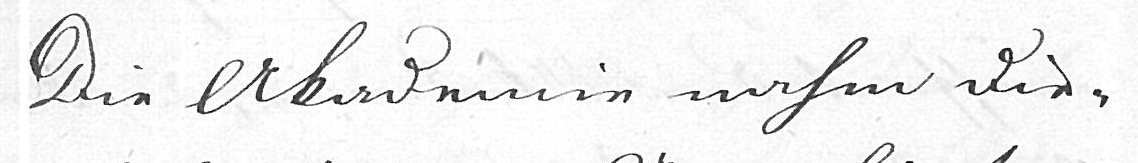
Die Akademie nahm die-
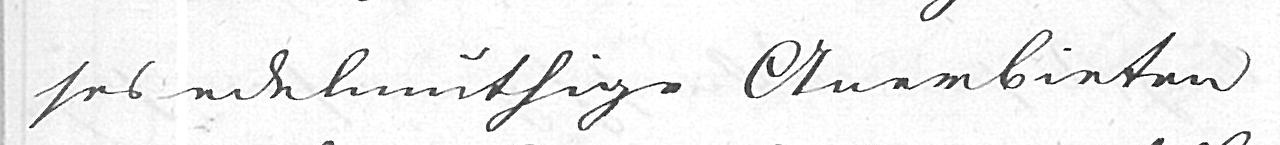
ses edelmüthige Anerbieten
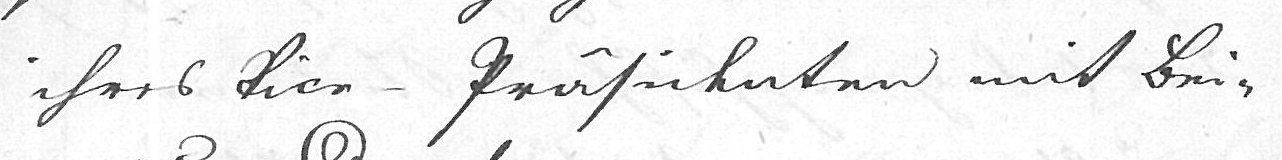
ihre Vice-Präsidenten mit Bei-
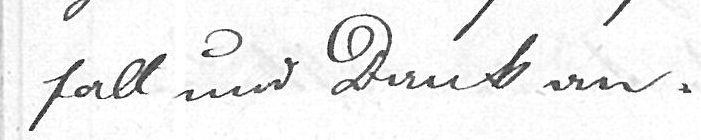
fall und Dank an.
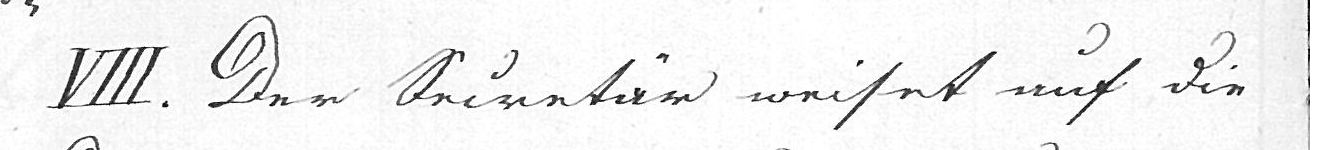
VIII. Die Secretär weiset auf die
